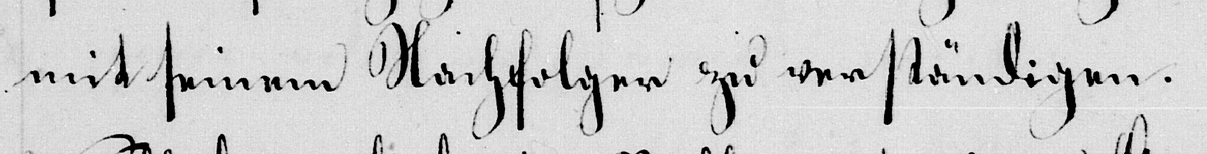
mit seinem Nachfolger zu verständigen.
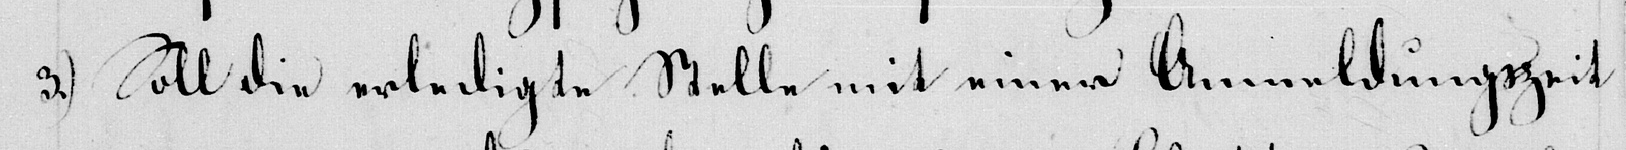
3.) Soll die erledigte Stelle mit einer Anmeldungszeit
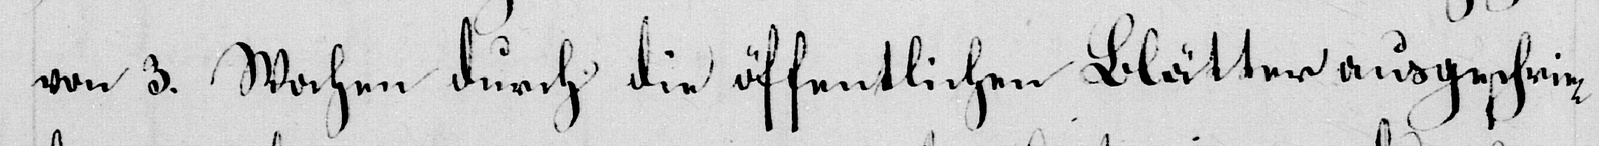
von 3. Wochen durch die öffentlichen Blätter ausgeschri¬
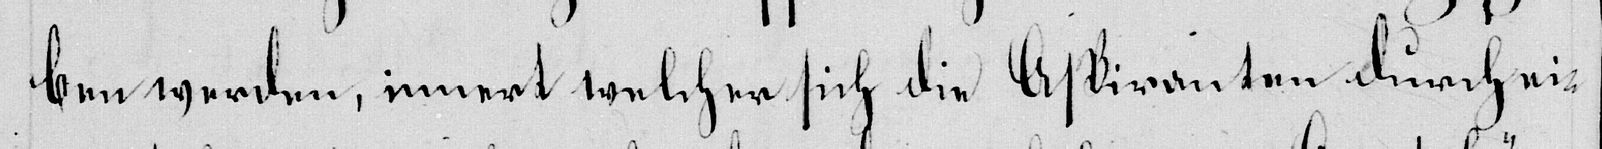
eben werden, innert welcher sich die Aspiranten durch ei¬
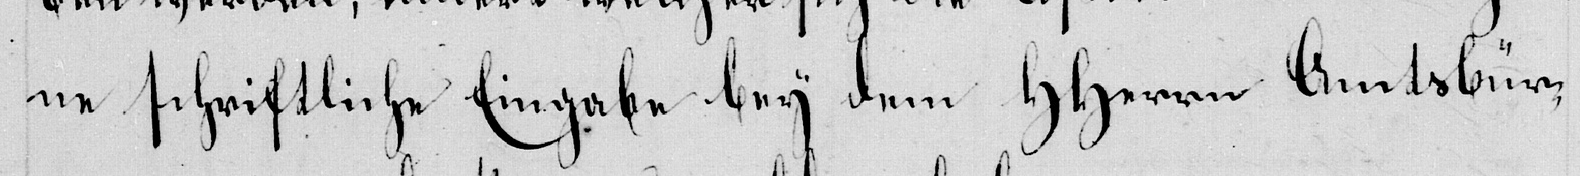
ne schriftliche Eingabe bey dem HHerrn Amtsbür¬
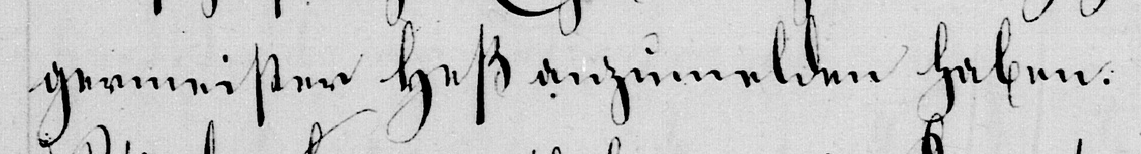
germeister Heß anzumelden haben.
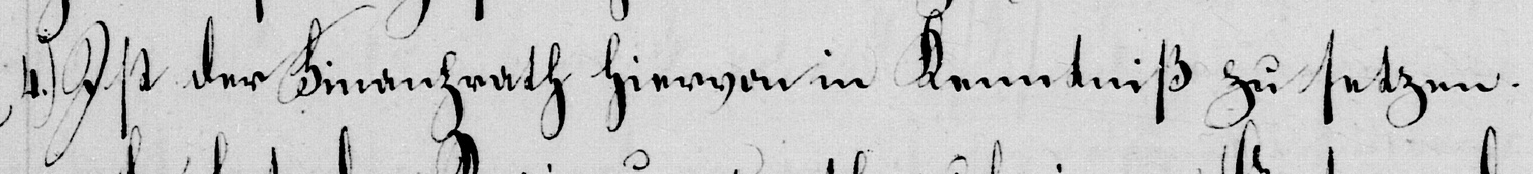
4.) Ist der Finanzrath hiervon in Kenntniß zu setzen.
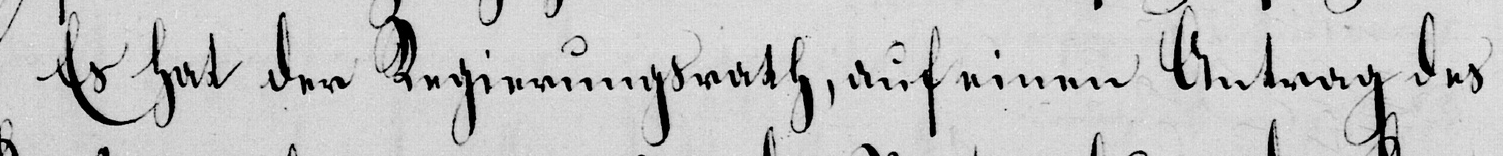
Es hat der Regierungsrath, auf einen Antrag des
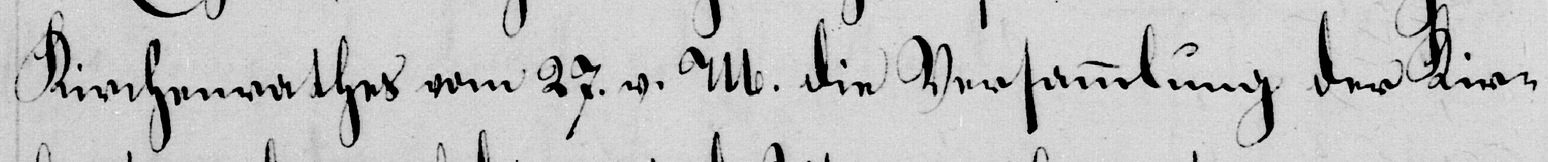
Kirchenrathes vom 27. v. M. die Versammlung der Kir¬
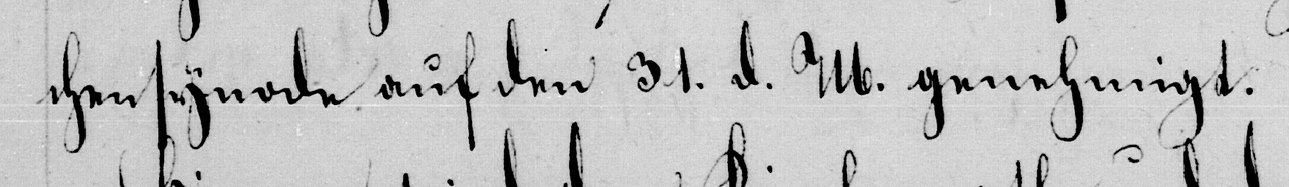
chensynode auf den 31. d. M. genehmigt.
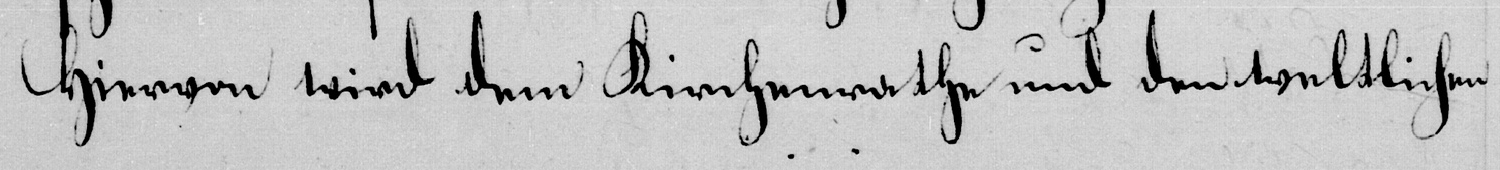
Hiervon wird dem Kirchenrathe und den weltlichen
